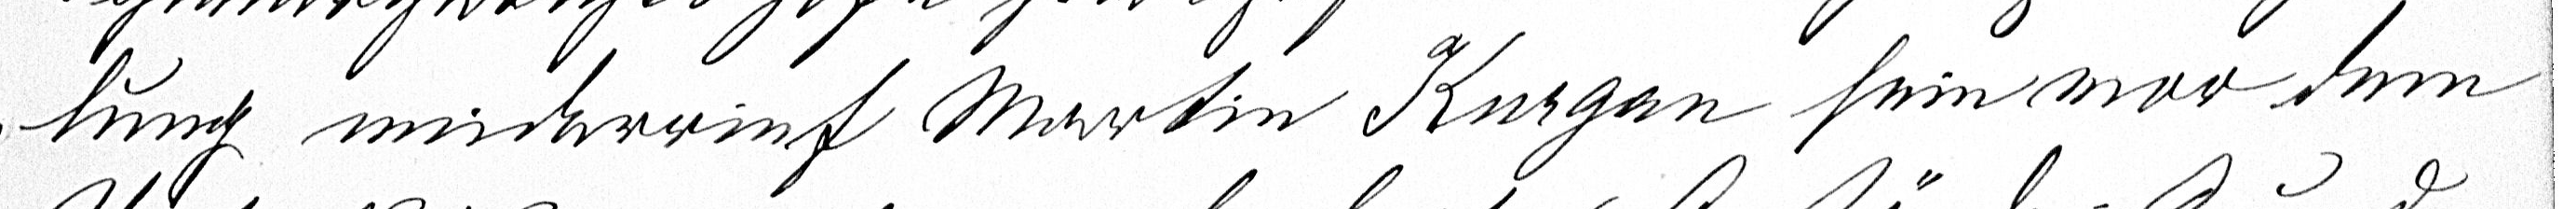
lung widerrief Martin Kurgan sein mor dem
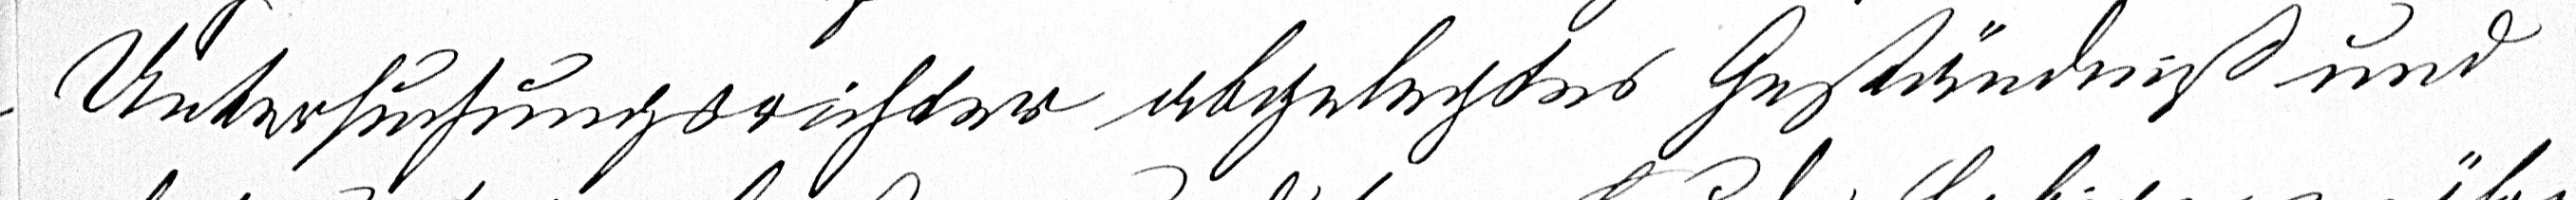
Untersuchungsrichter abgelegtes Geständniß und
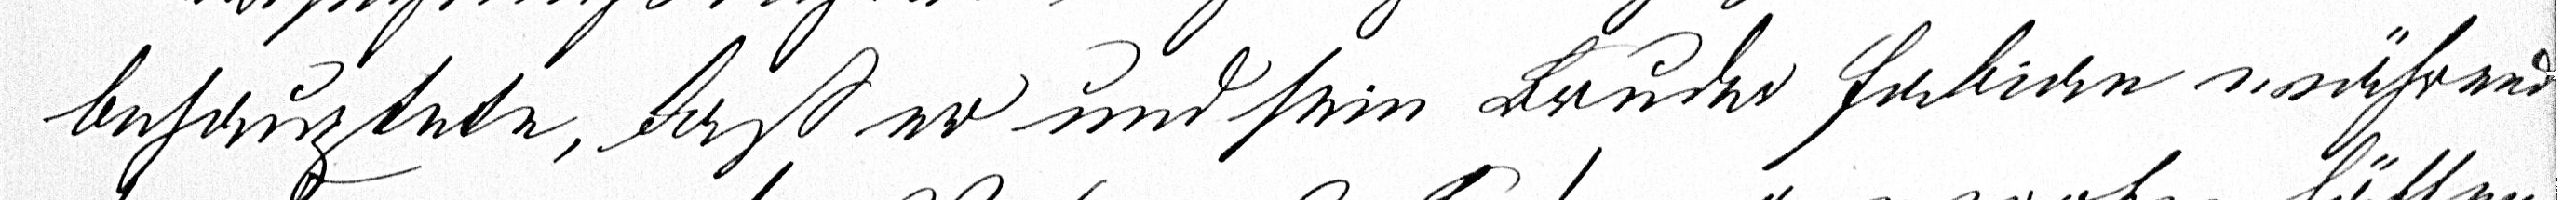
behauptete, daß er und sein Bruder Fabian während
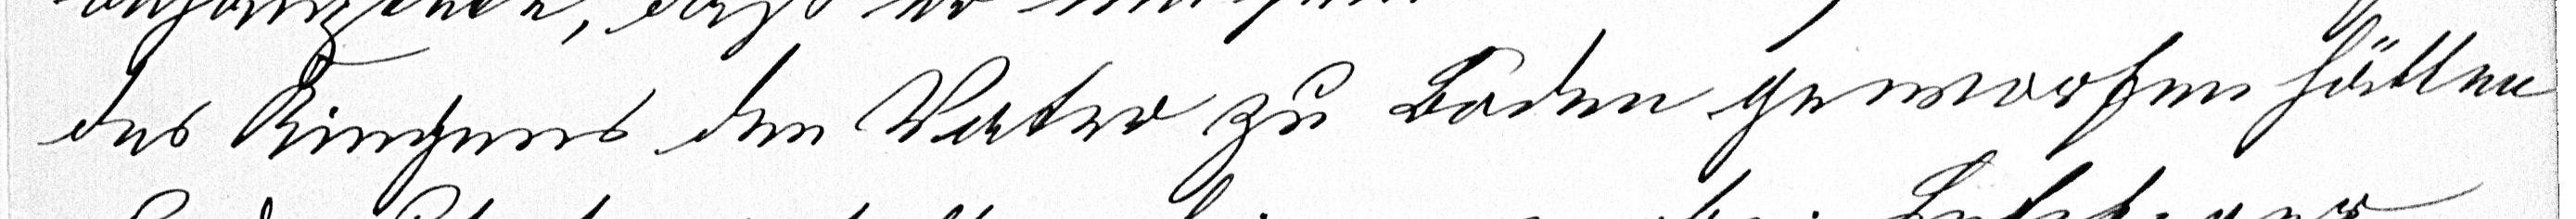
des Ringens den Vater zu Boden geworfen hätten
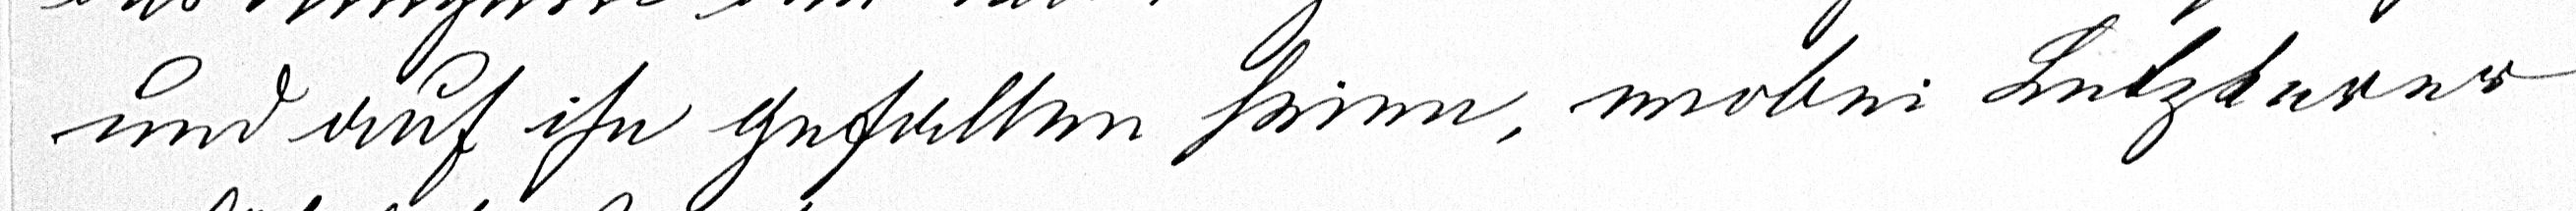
und auf ihn gefallen seien, wobei Letzerer
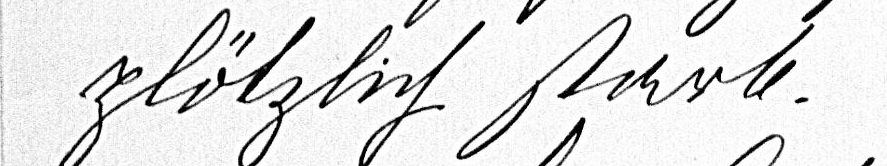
plötzlich starb.
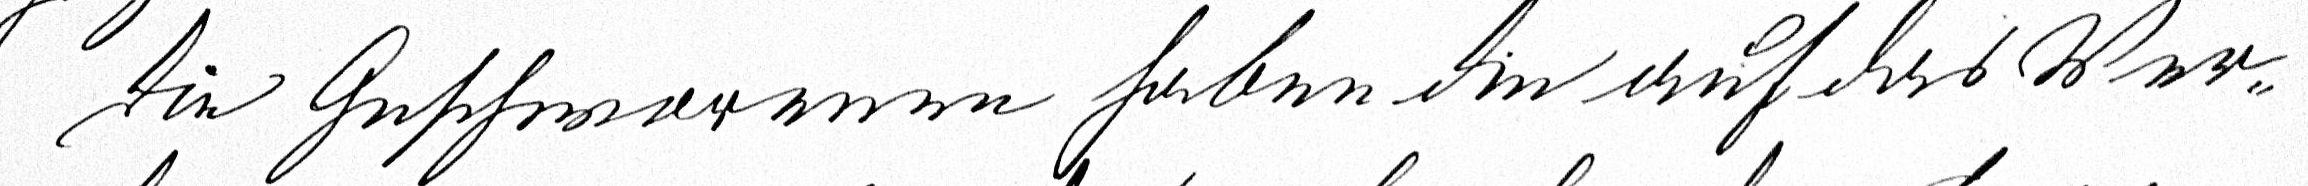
Die Geschworenen haben die auf das Ver¬
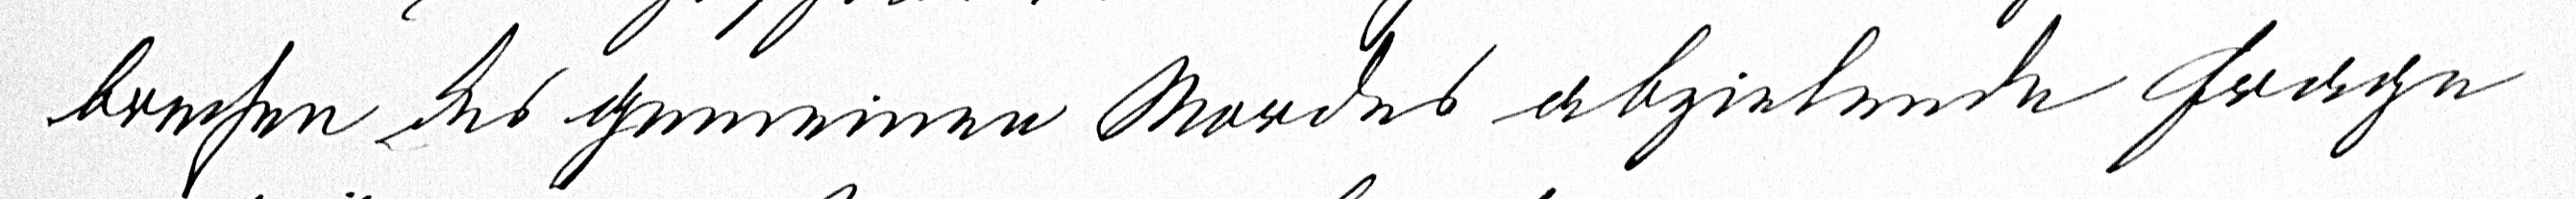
brechen des gemeinen Mordes abzielende Frage
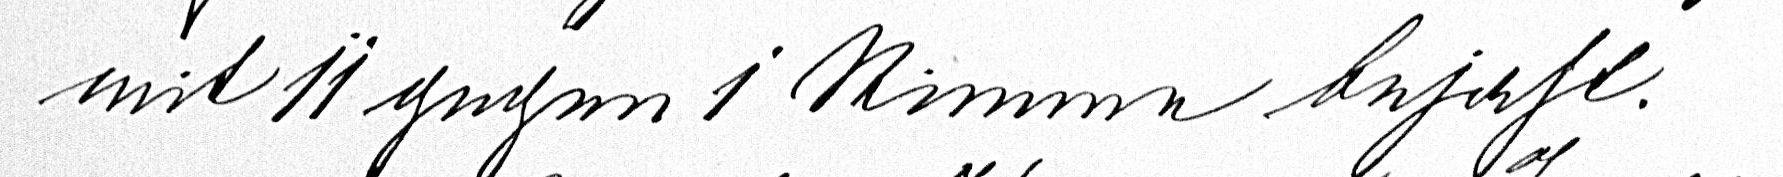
mit 11 gegen 1 Stimme bejahl.
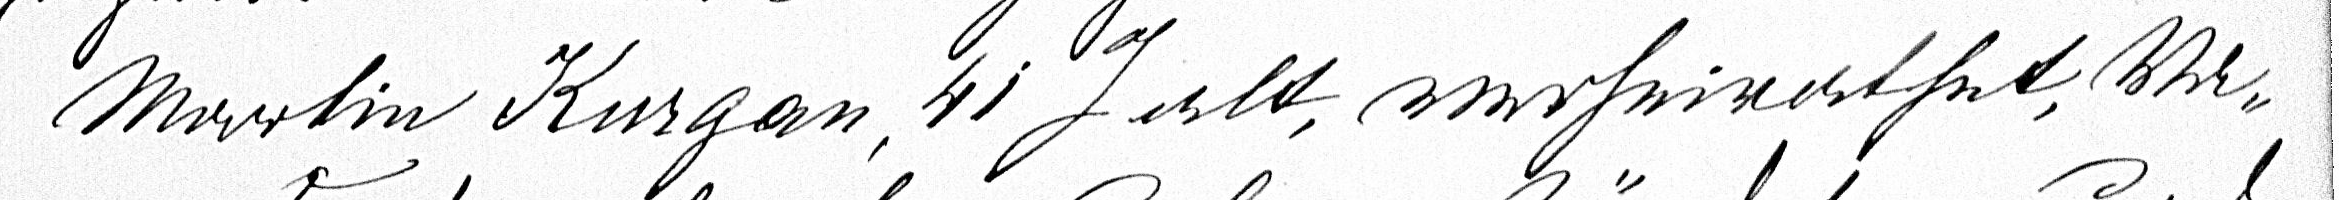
Martin Kurgan, 41 J alt, verheirathet, Va¬
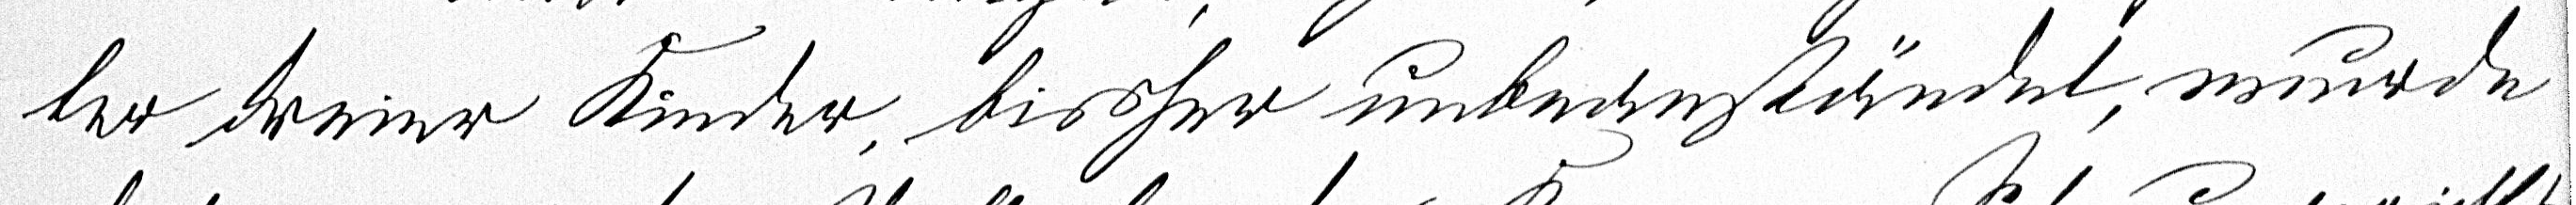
ter dreier Kinder, bisher unbeanständet, wurde
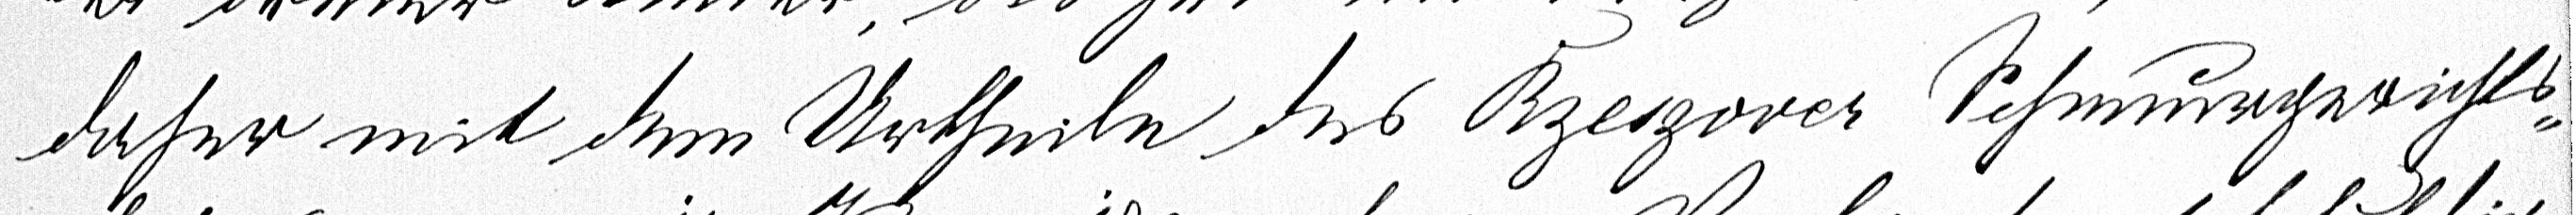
daher mit dem Urtheile des Rzeszover Schwurgerichts¬
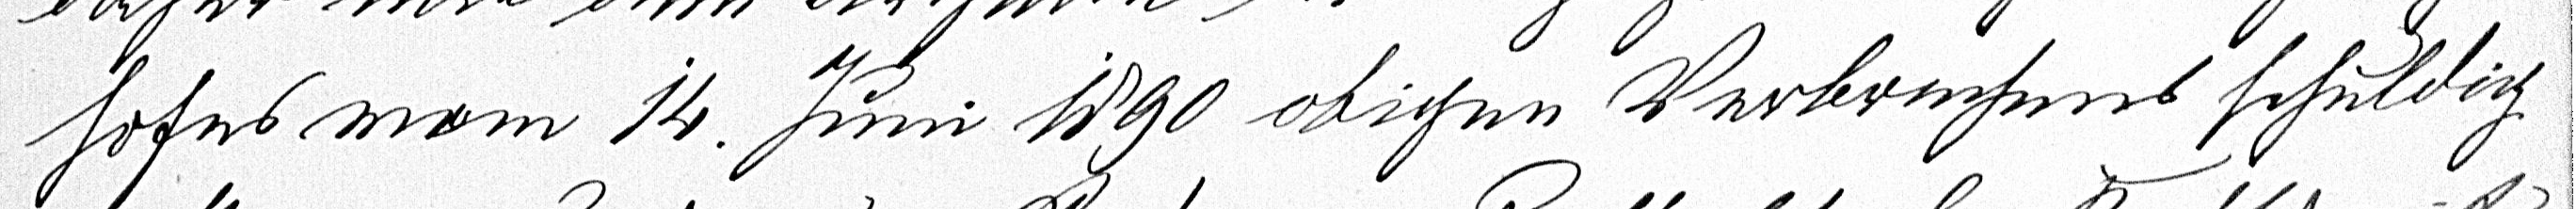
hofes vom 14. Juni 1890 obigen Verbrechens schuldig
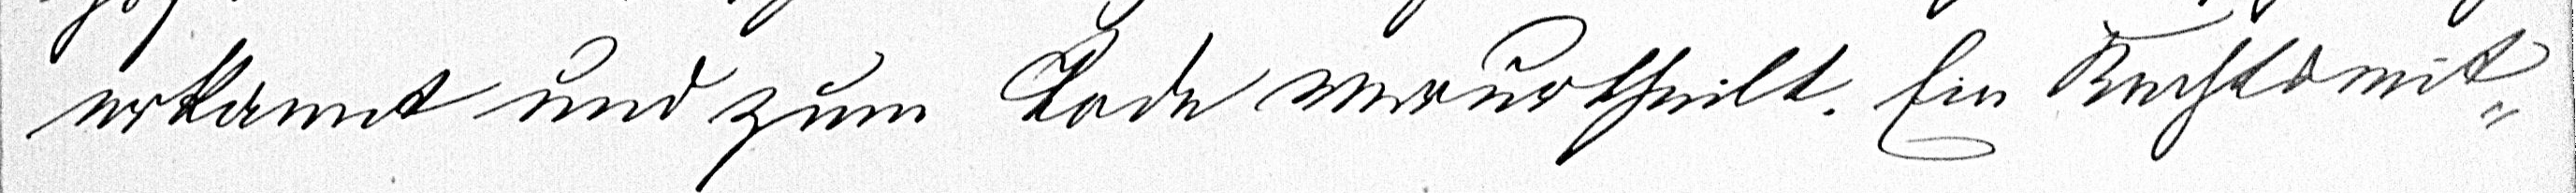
erkannt und zum Tode verurtheilt. Ein Rechts mit-
